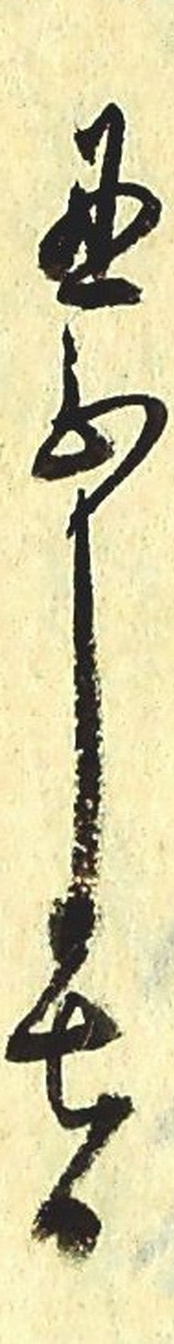丑正月七日
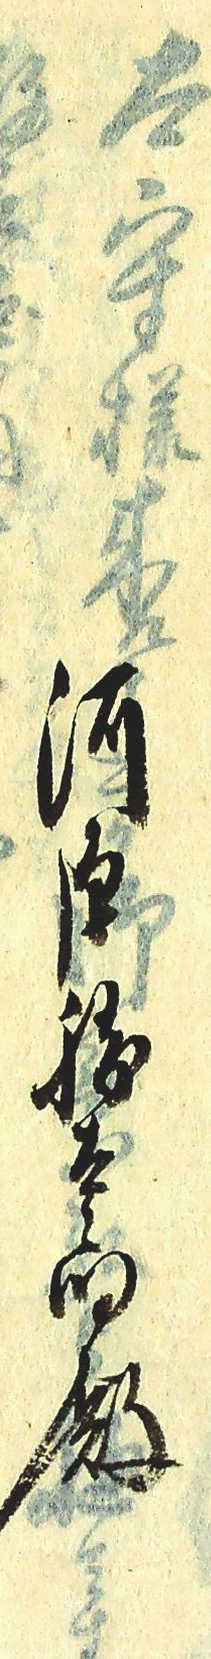河原勝太郎殿
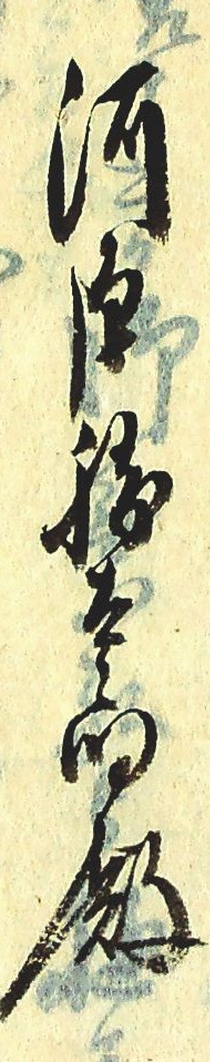河原勝太郎殿
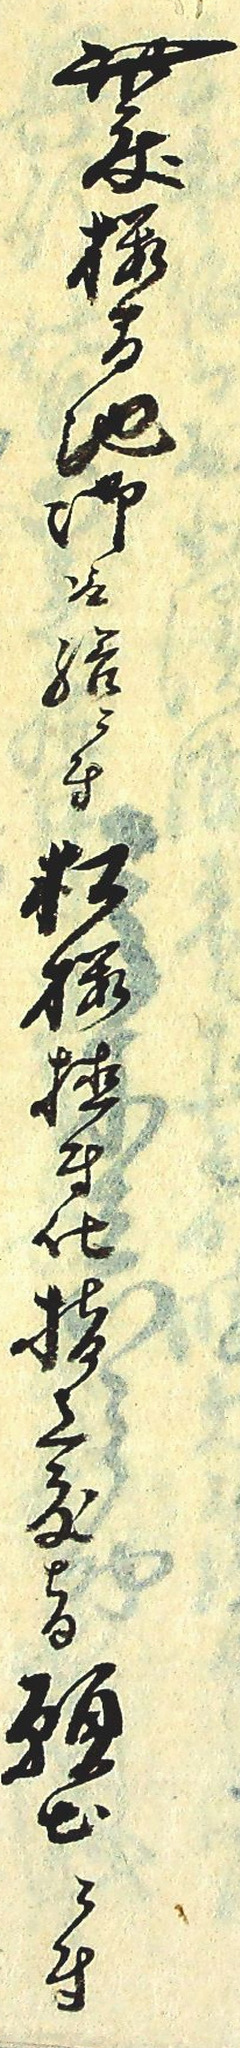此度桜間池御取繕に付松桜植付仕指上度旨願出に付
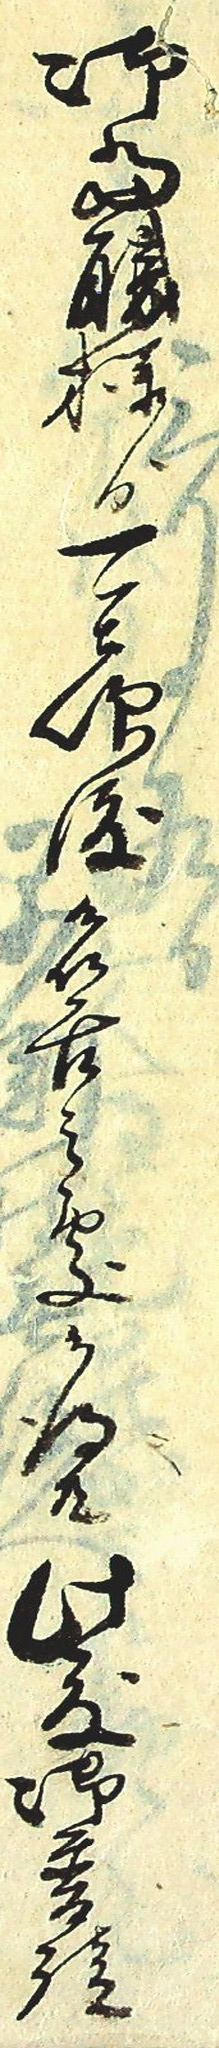御当職様ゟ可被仰渡候筈之処候得共此度御普請
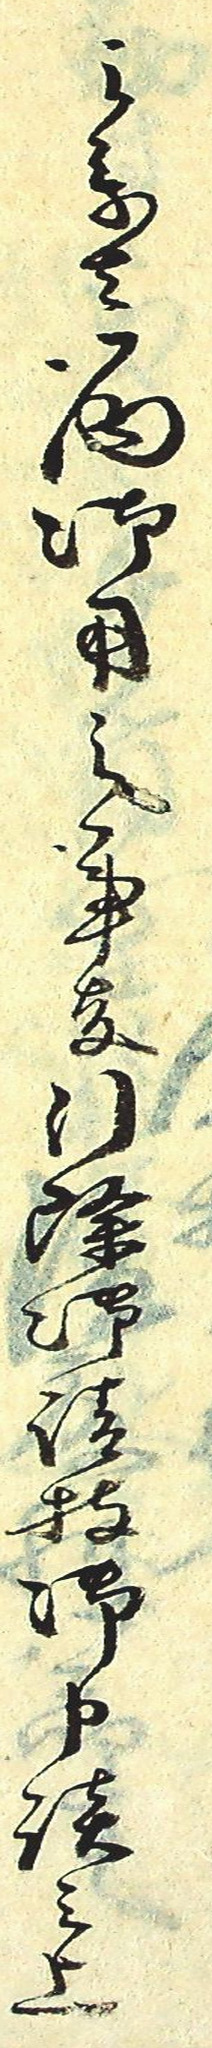之義は御内御用之事故引除御請持御申談之上
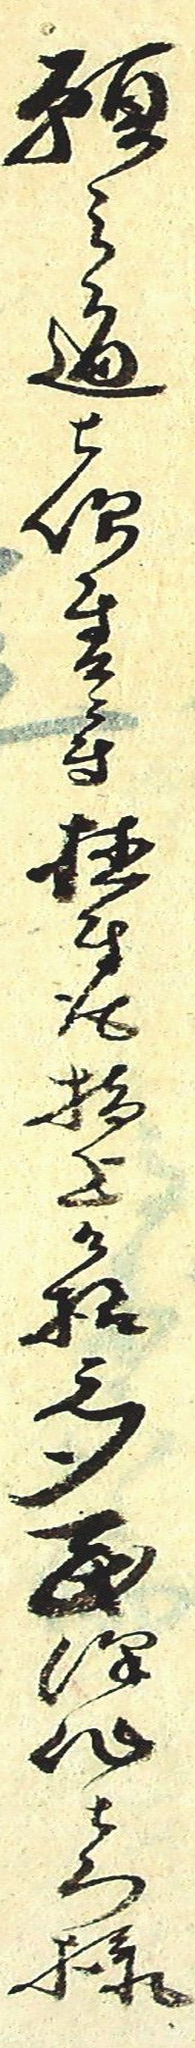願之通被仰付候に付植付仕指上候様元〆民沢作右衛門様
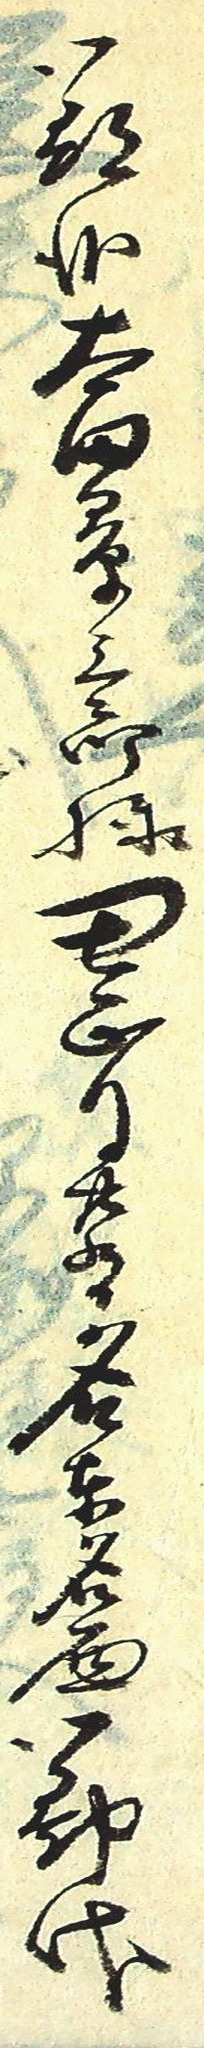御郡代太田景三郎様丑正月廿九日名東名西御郡代
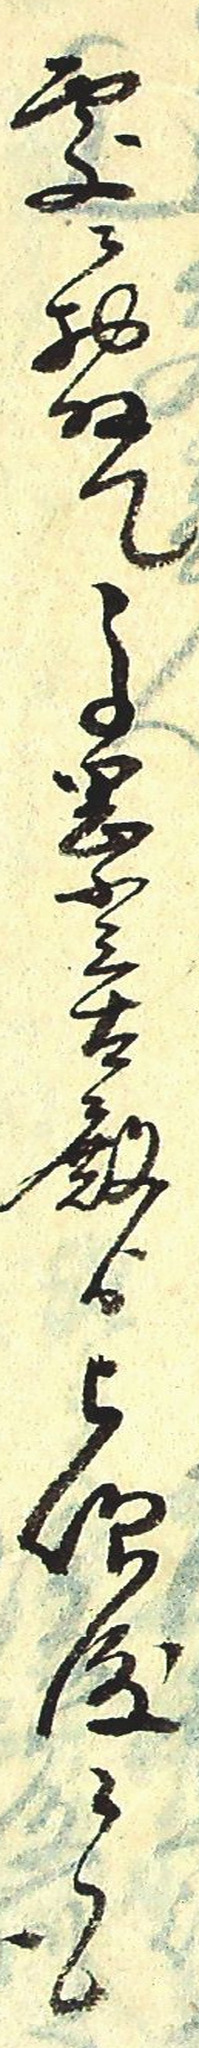処におゐて高岡小三太殿ゟ被仰渡候以上
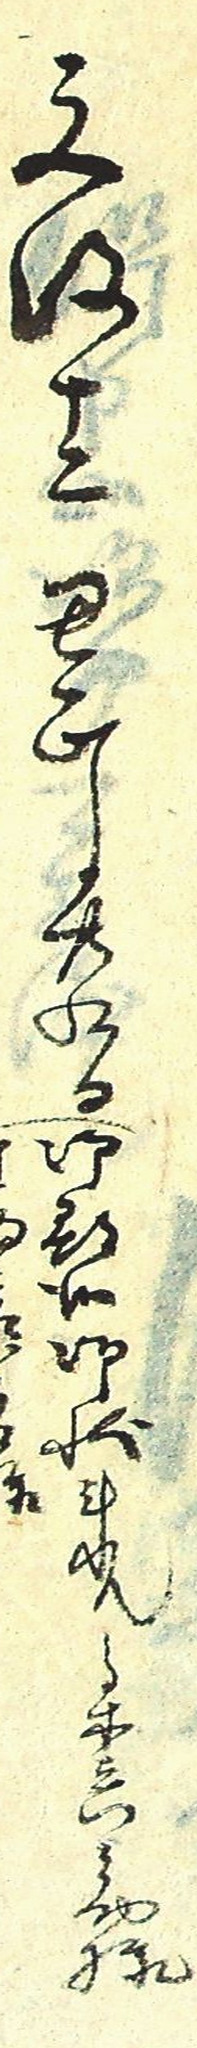文政十二丑年正月廿九日御郡代御状来る高木真之助様

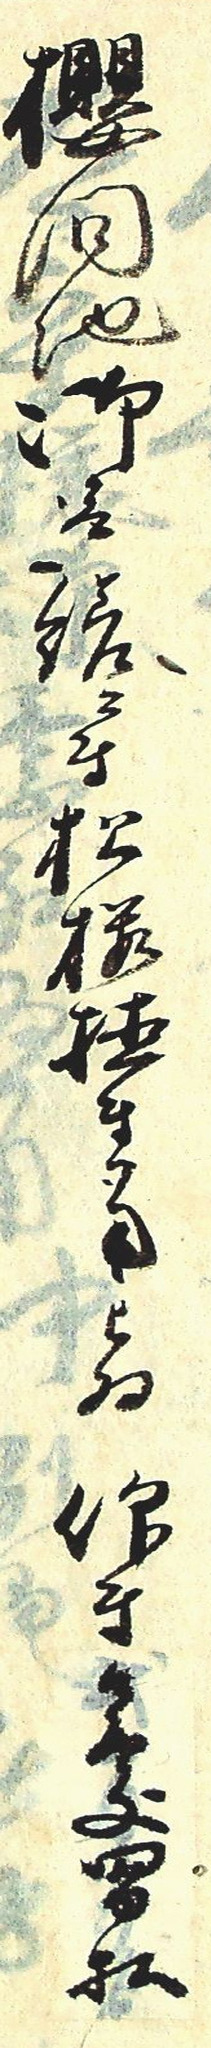桜間池御取繕に付松桜植付御用被為仰付候処男松
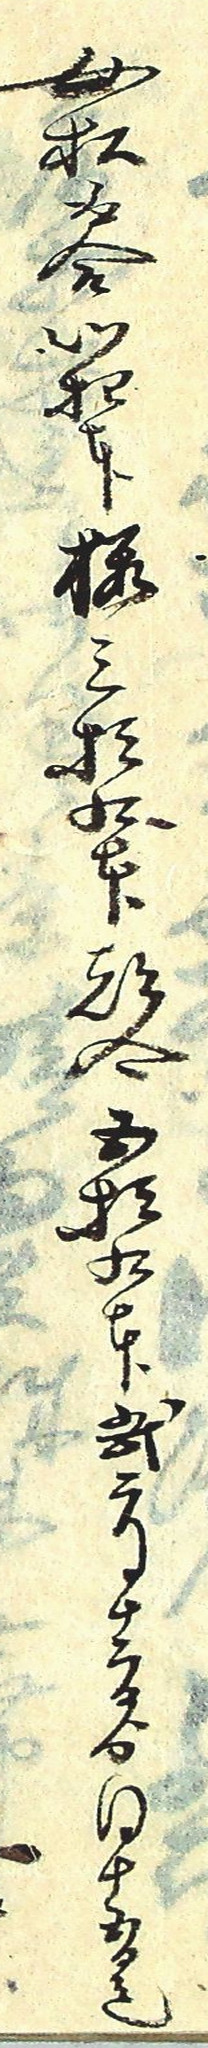女松取合弐拾本桜三拾九本都合五拾九本当二月十二日ゟ同十五日迄
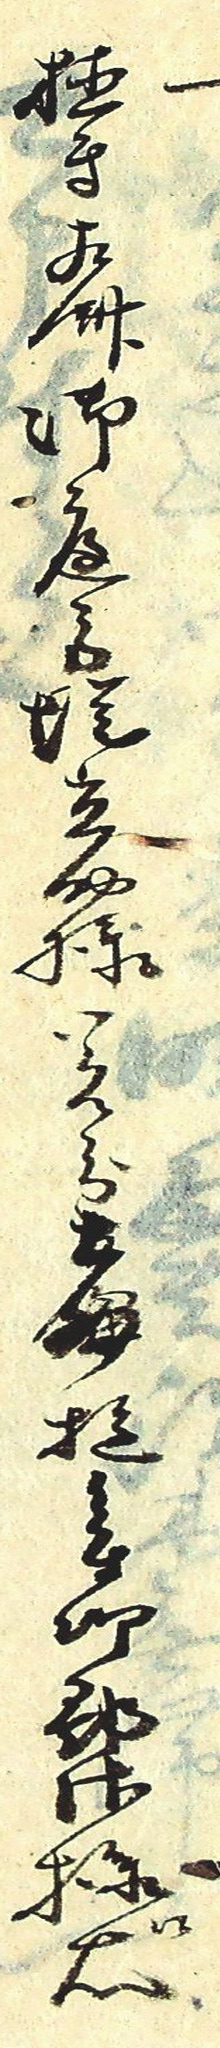植付相済御庭方堤立助様御見分被為遊候に付御郡代様え右
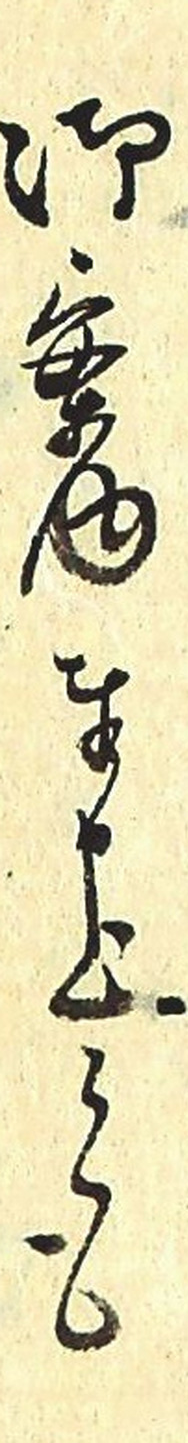御案内奉申上候以上
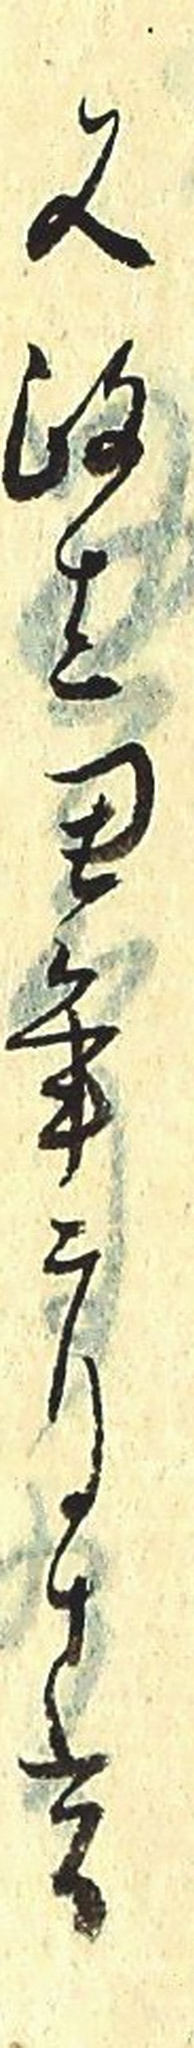文政十二丑年二月十六日
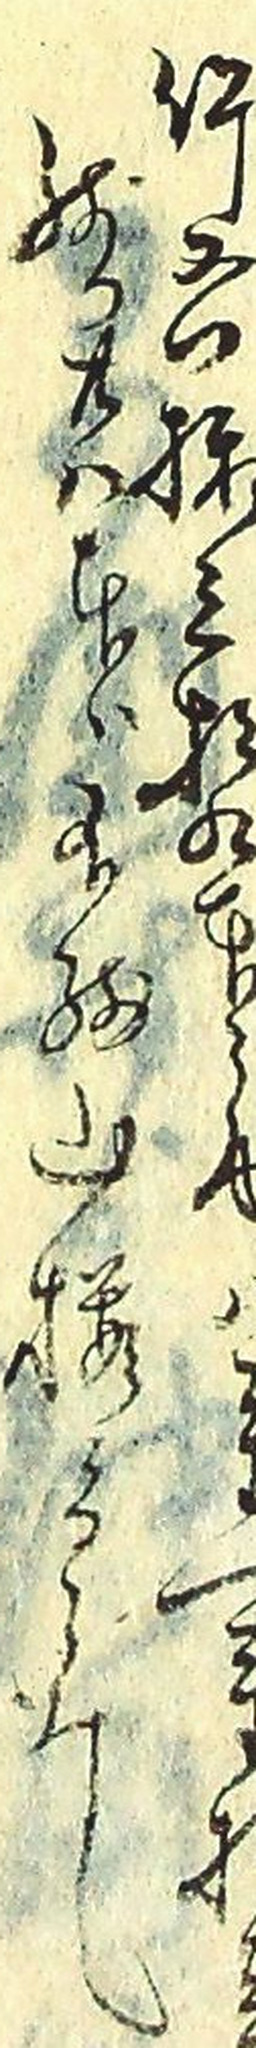残り廿八本は不残山桜にて御座候
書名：諸御願書控(弐番）
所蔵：鳴門教育大学 Naruto University of Education
